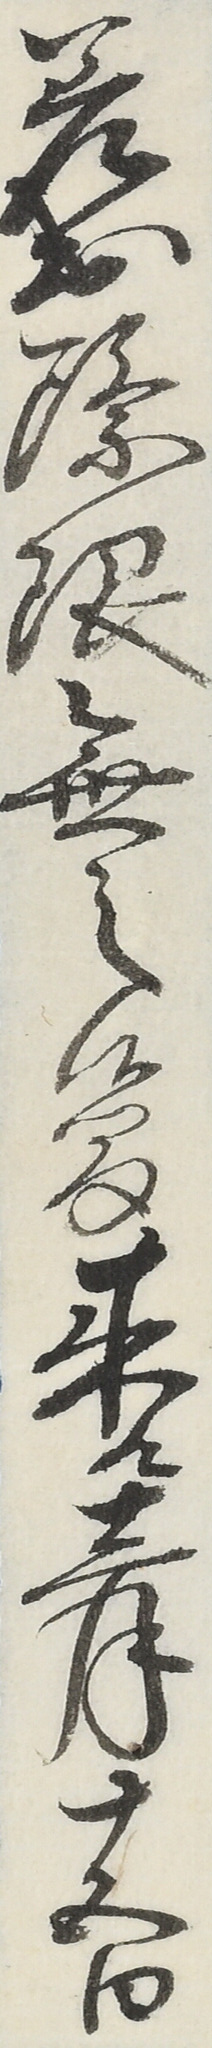差出際限無之候間来ル十二月十五日
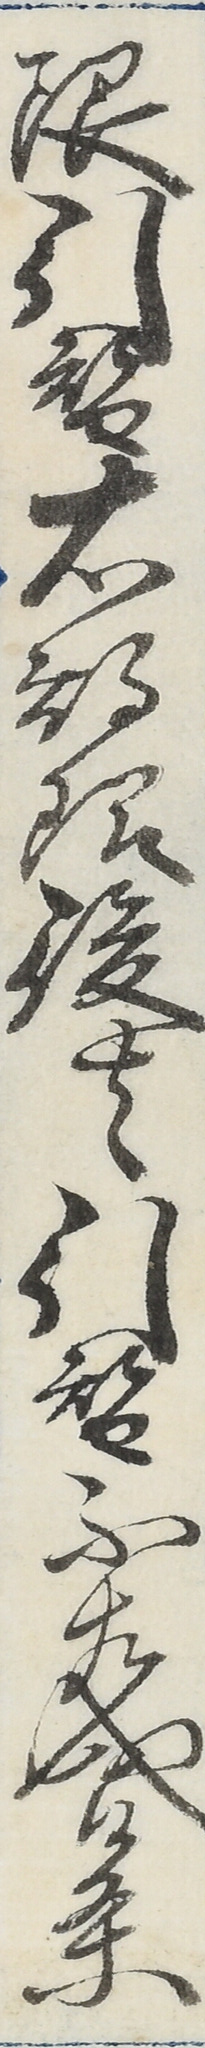限引替右期限後者引替不相成候条

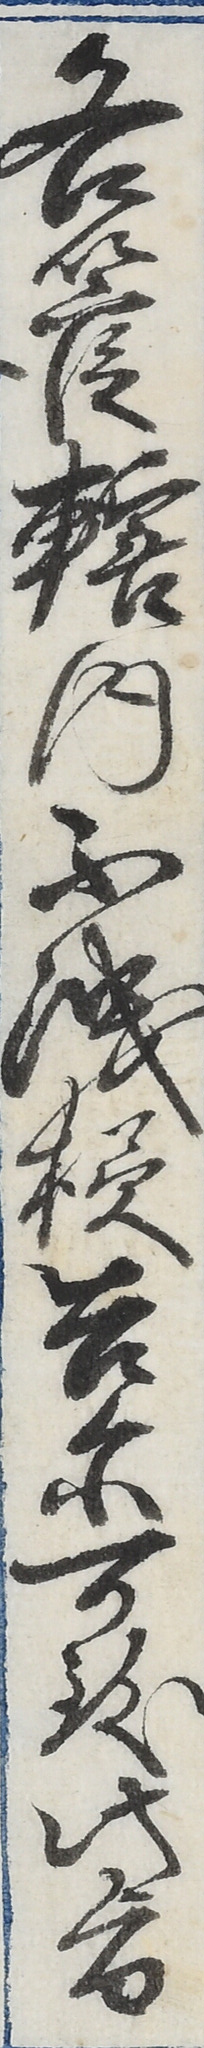各管轄内不洩様告示可致此旨
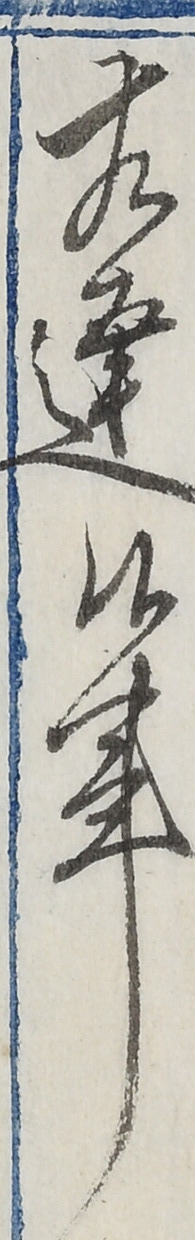相達候事
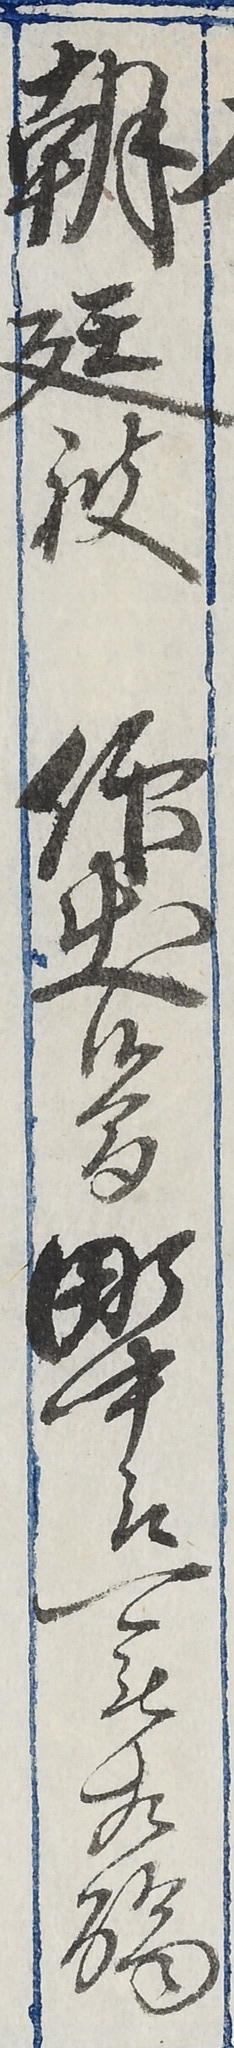朝廷被仰出候間町中江可被相触
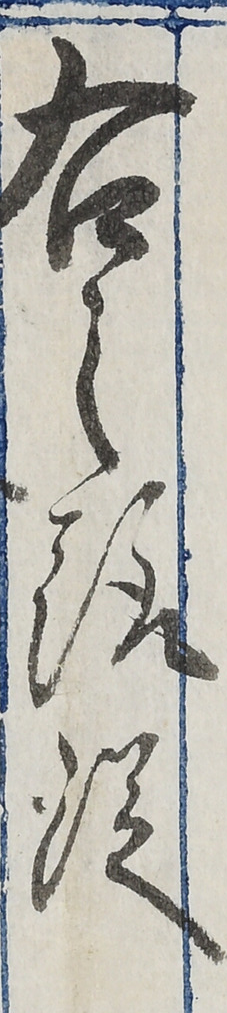右之趣従
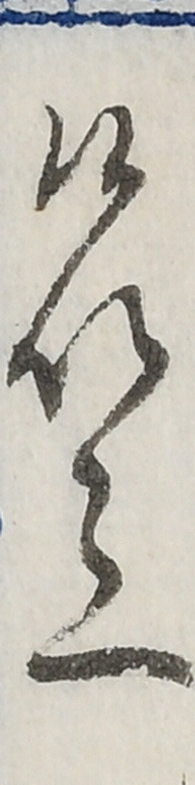候以上
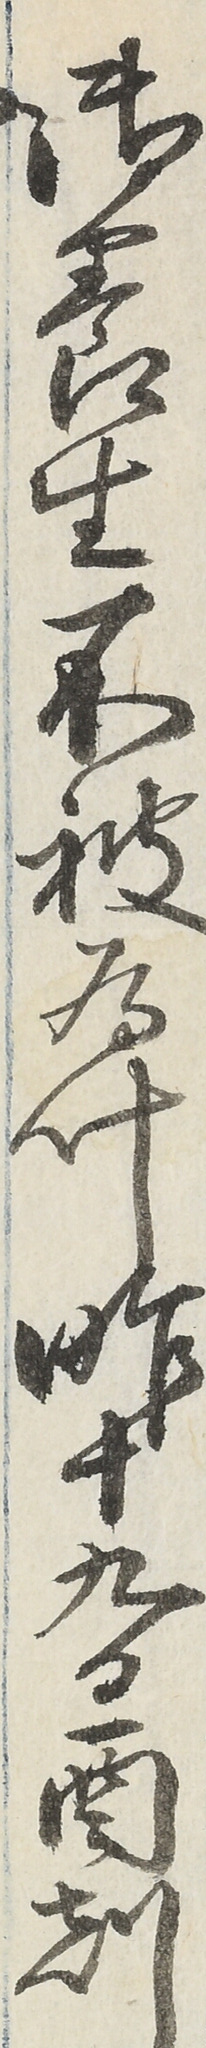御養生不被為叶昨十九日酉刻
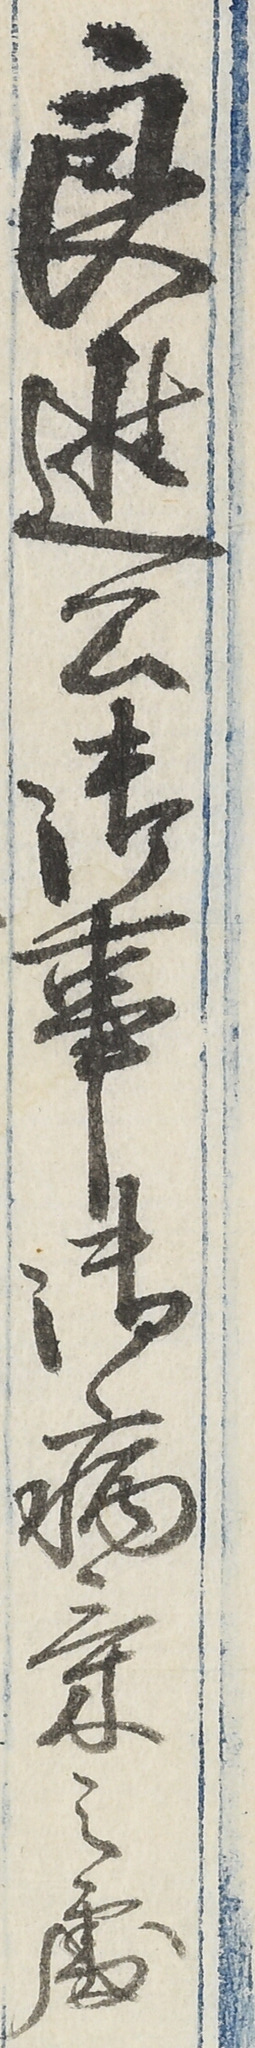良進公御事御病気之処
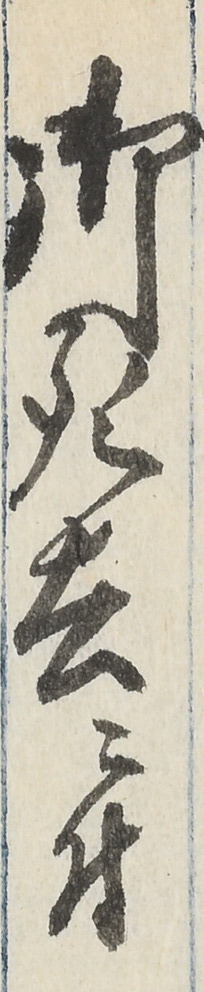御死去ニ付
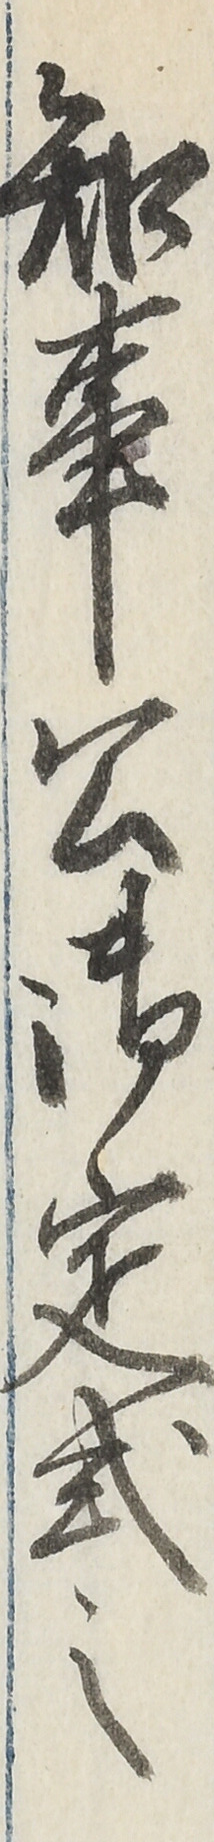知事公御定式之
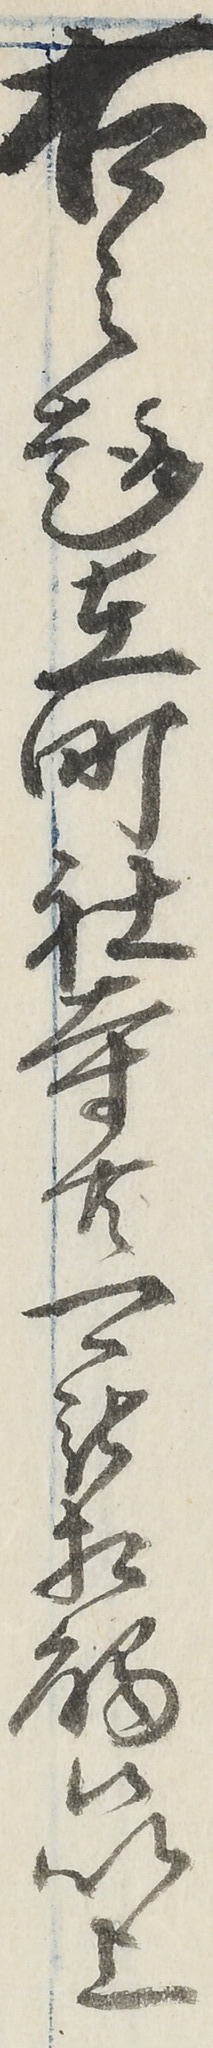右之趣在町社寺共可被相触候以上
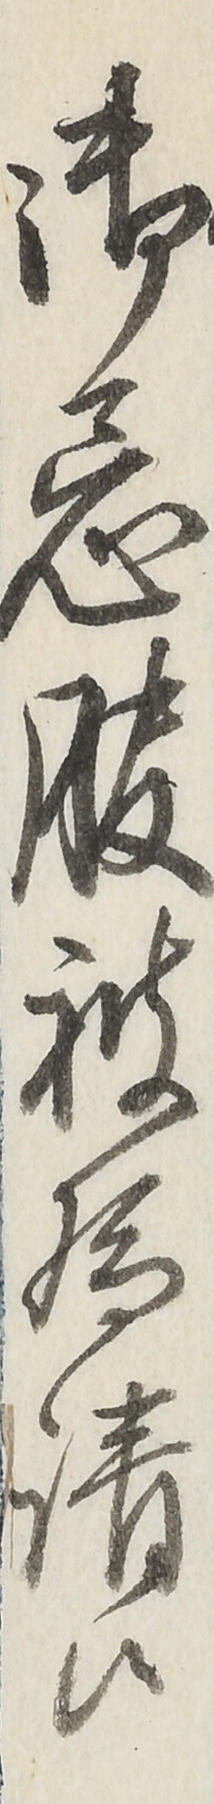御忌服被為請候
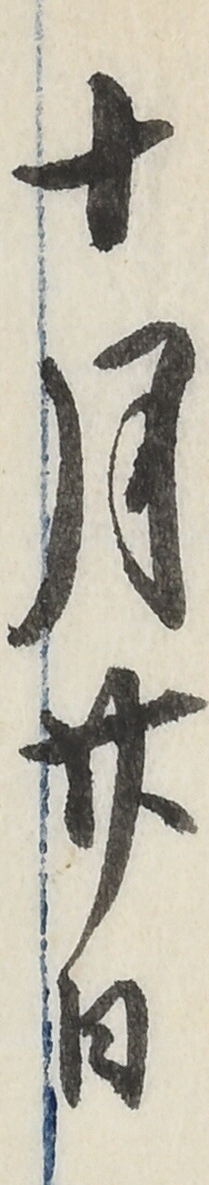十月廿日

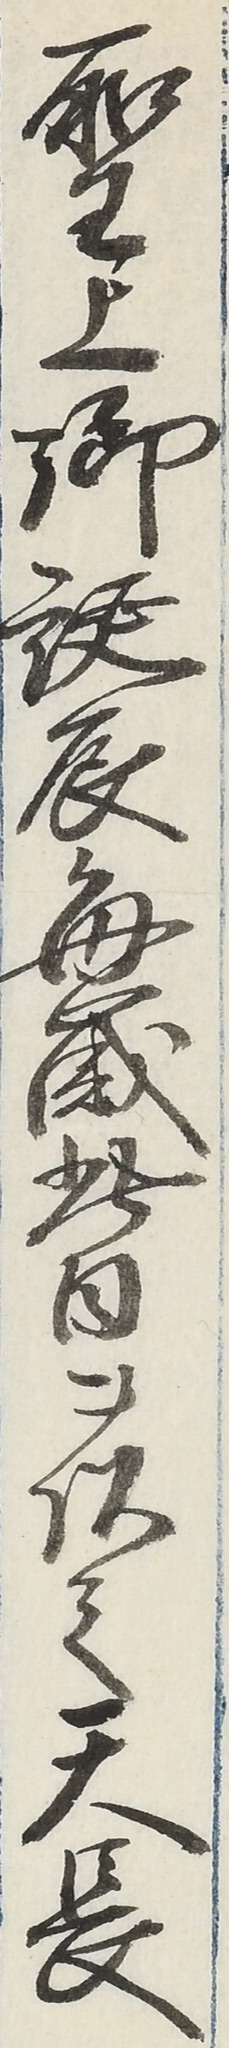聖上御誕辰毎歳此日ヲ以て天長
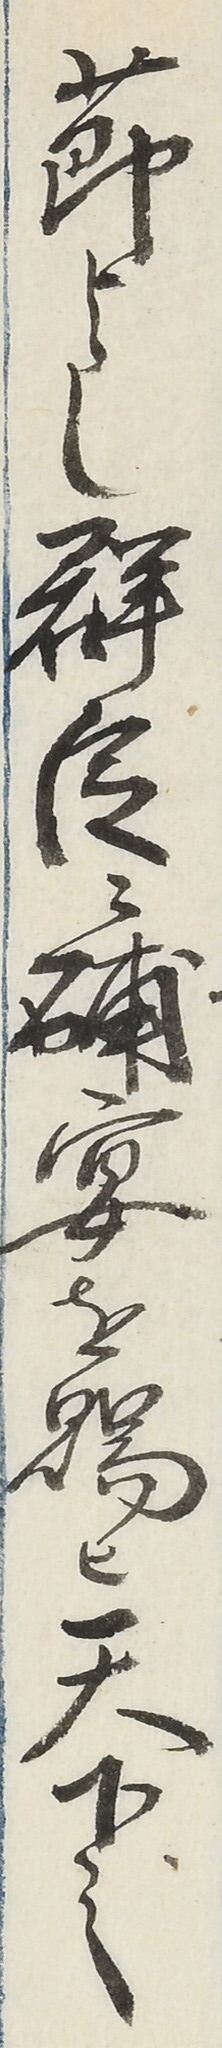節とし群臣ニ酺宴を賜ヒ天下之
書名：布達書留
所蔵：伊那市立高遠町図書館・合同会社AMANE
